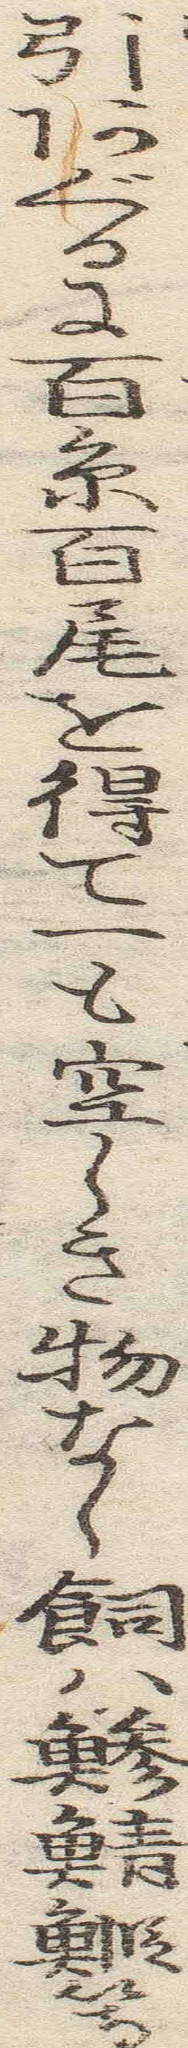引あぐるに百糸百尾を得て一も空しき物なし飼は鯵鯖鰕等
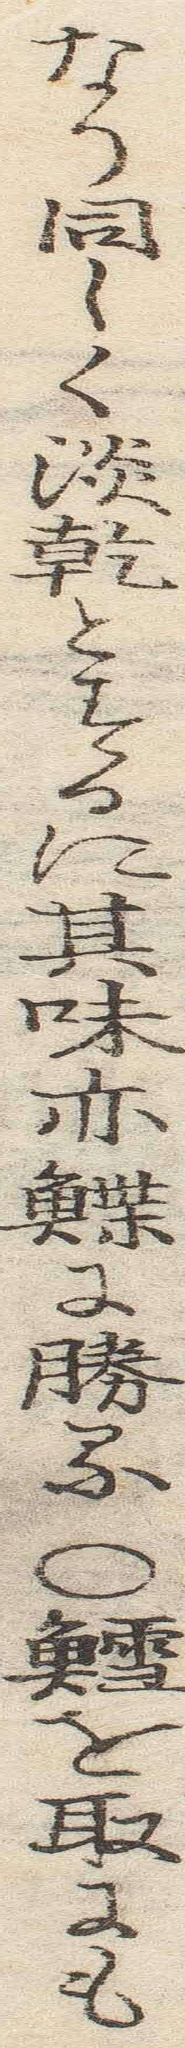なり同しく淡乾とするに其味亦鰈に勝る○鱈を取にも
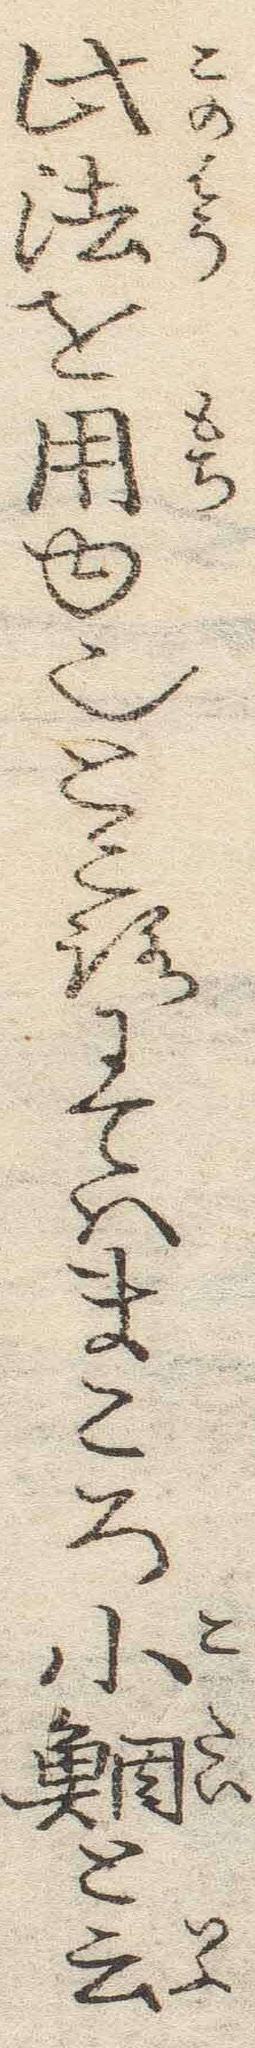此法を用ゆ也ところにてはまころ小鯛と云
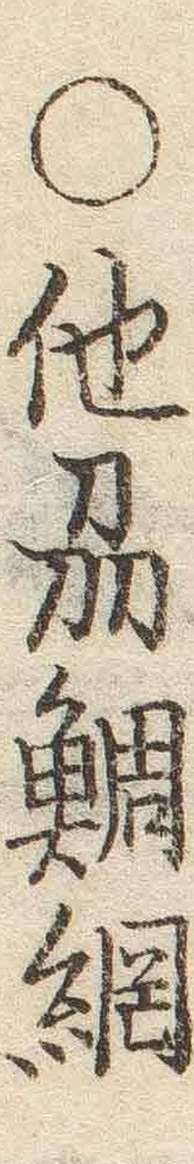○他州鯛網
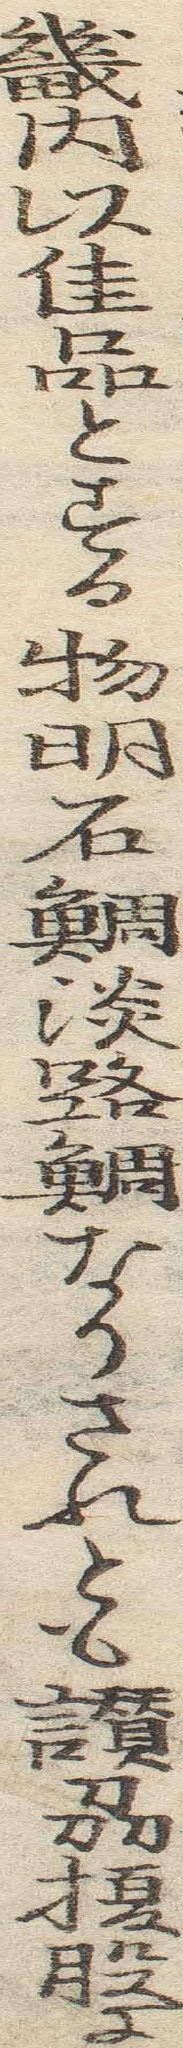畿内以佳品とする物明石鯛淡路鯛なりされとも讃州榎股に
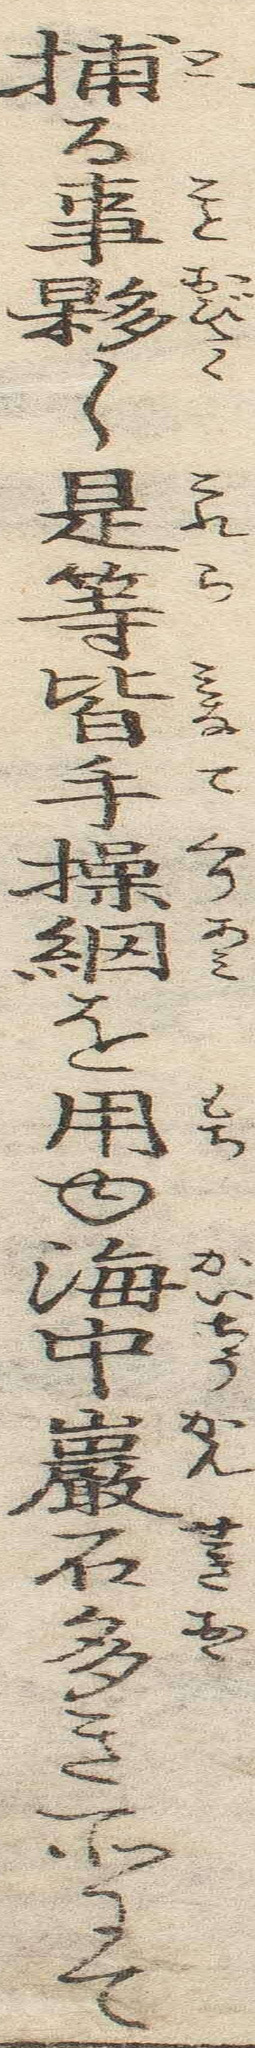捕る事夥し是等皆手操網を用ゆ海中巌石多き所にて
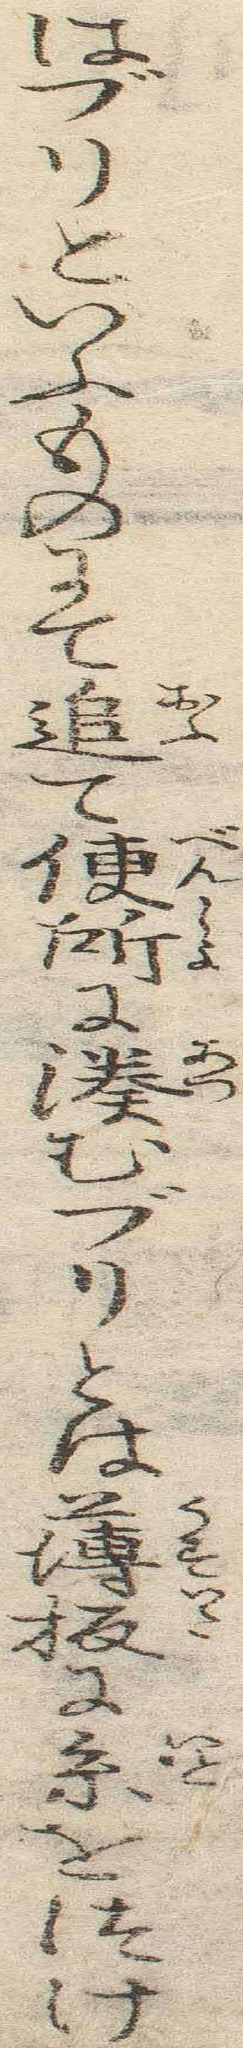はブリといふものにて追て便所に湊むブリとは薄板に糸をつけ
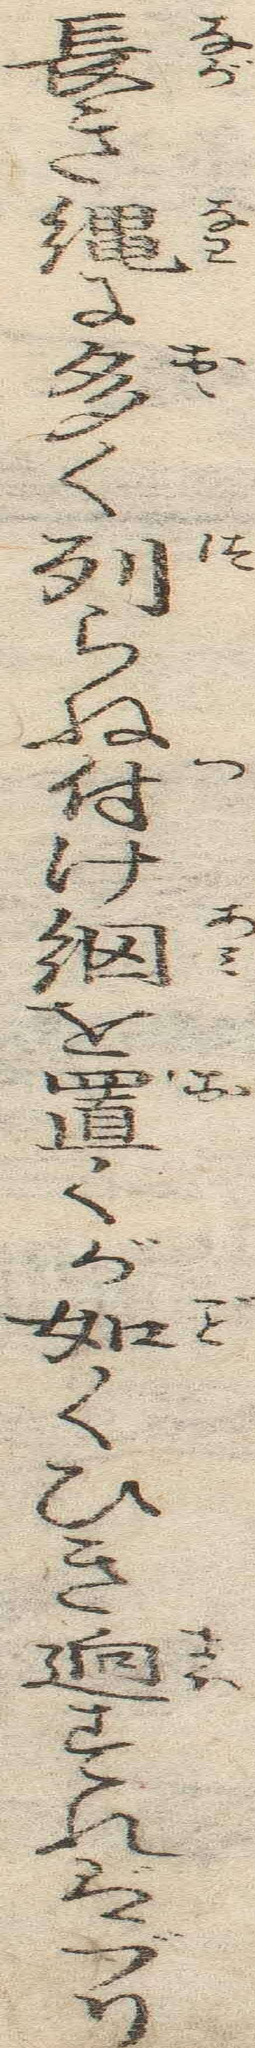長き縄に多く列らね付け網を置くが如くひき廻すればブリ

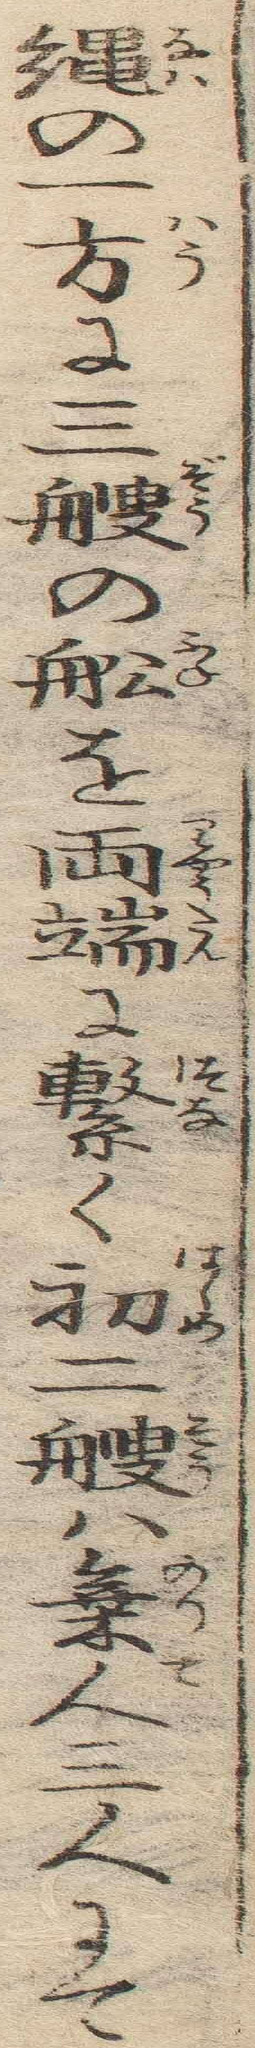縄の一方に三艘の船を両端に繋く初二艘は乗人三人にて
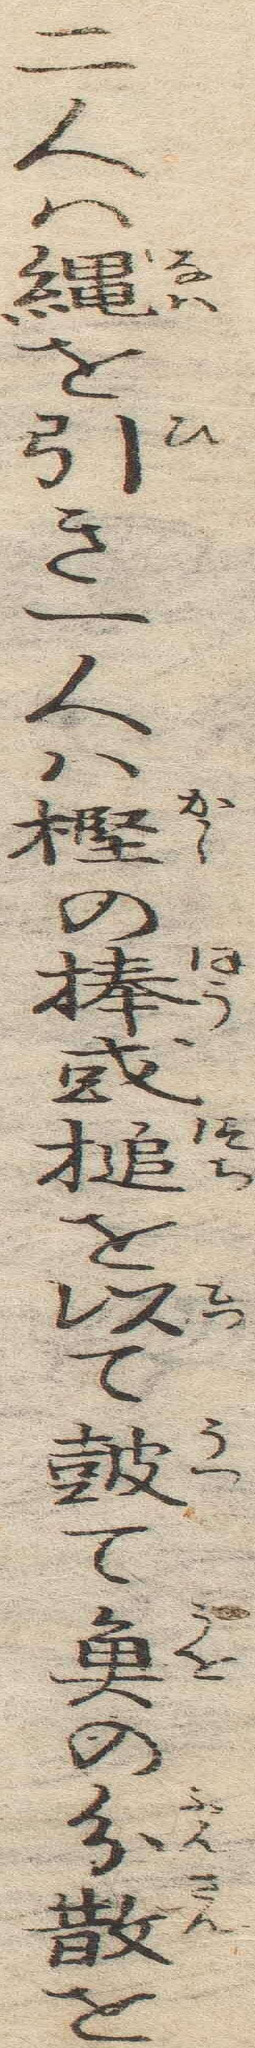二人は縄を引き一人は樫の棒或槌を以て鼓て魚の分散を
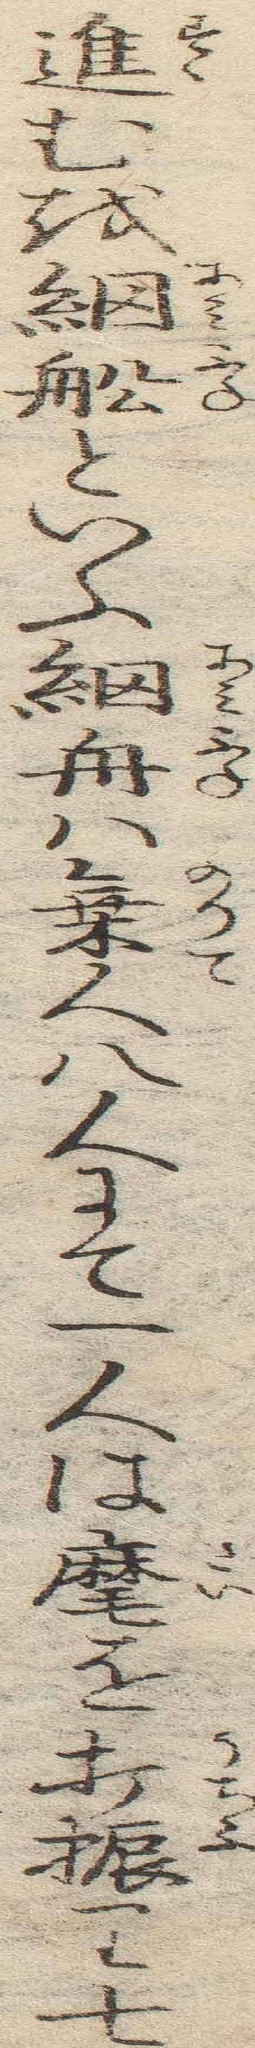進むを網船といふ網舟は乗人八人にて一人は麾を打振り七
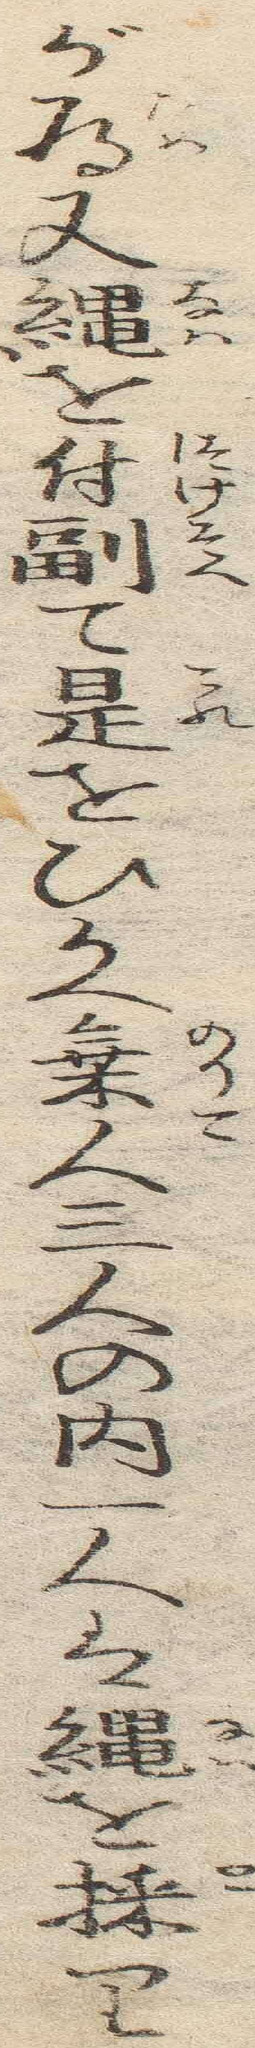が為又縄を付副て是をひかへ乗人三人の内一人は縄を採り
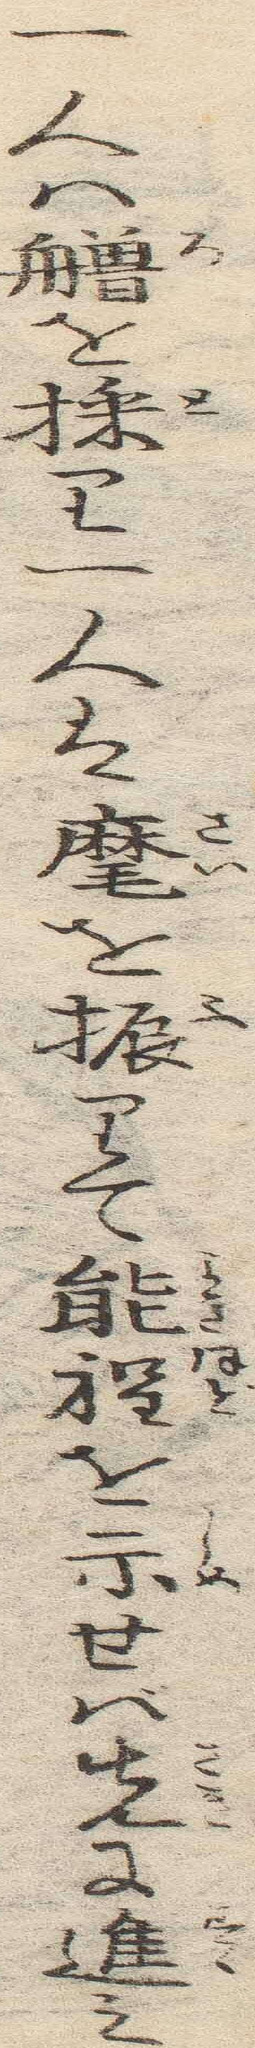一人は艪を採り一人は麾を振りて能程を示せば先に進み
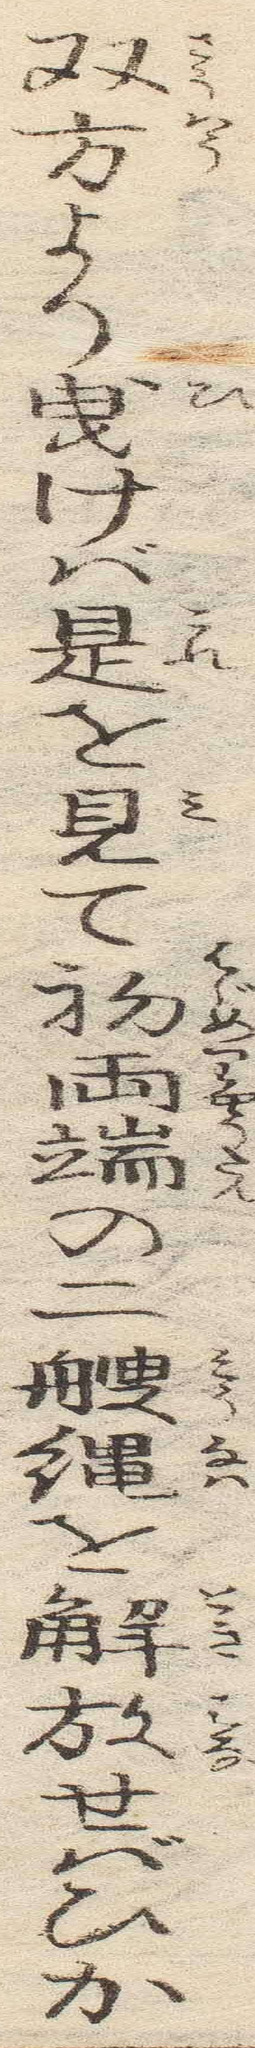双方より曳けば是を見て初両端の二艘縄を解放せばひか
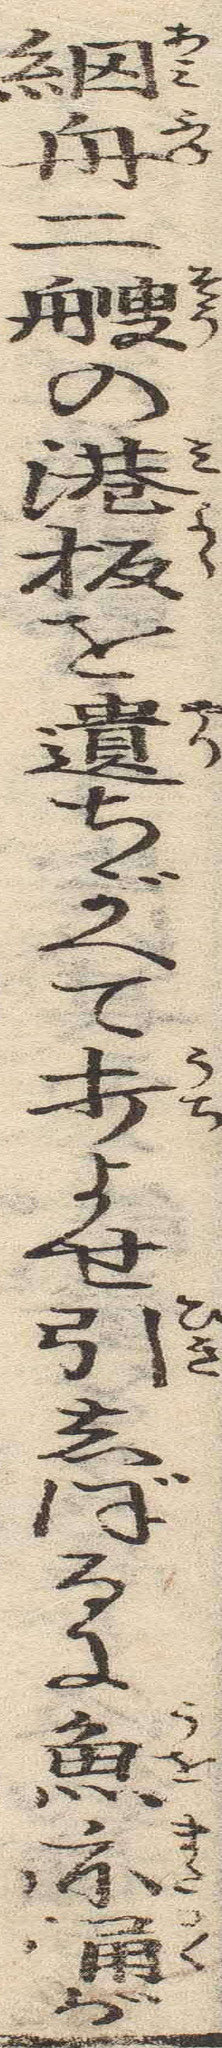網舟二艘の港板を遺ちがへて打よせ引しぼるに魚亦涌が
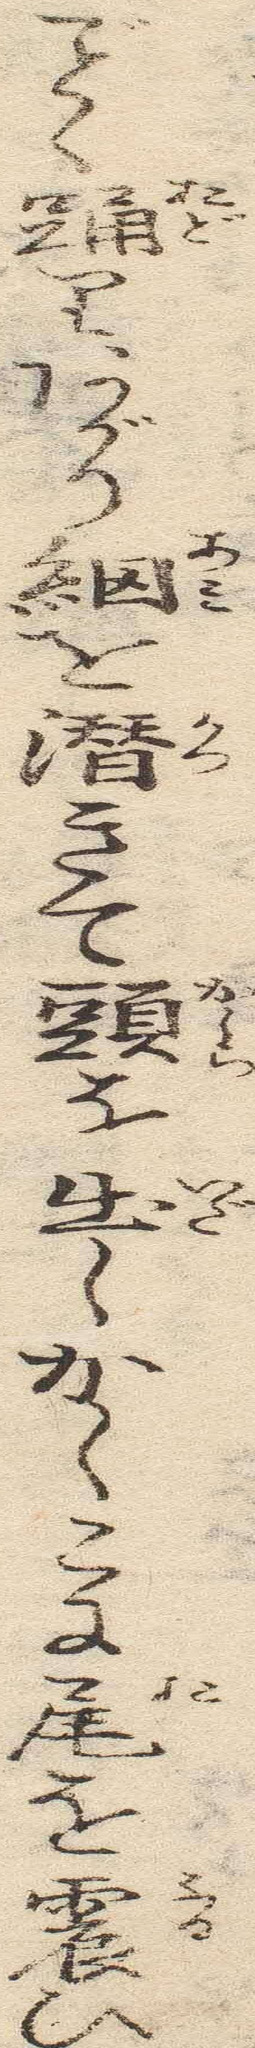ごとく踊りあがり網を潜きて頭を出しかしこに尾を震ひ
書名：日本山海名産図会
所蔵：東京学芸大学附属図書館 国文学研究資料館
